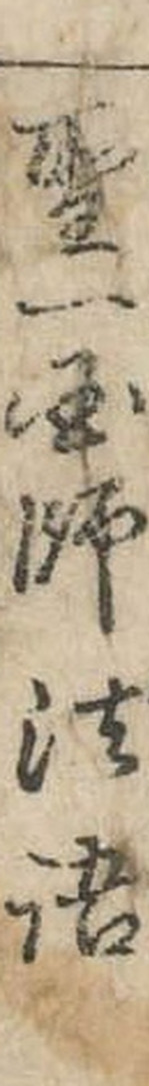聖一国師法語
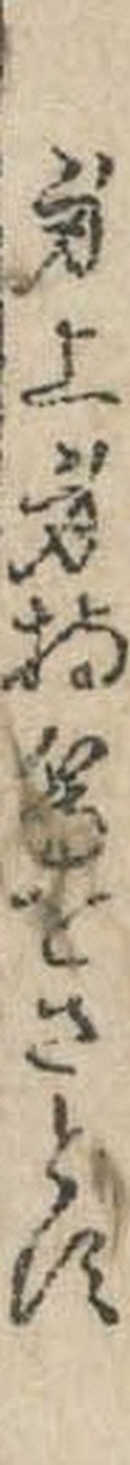身上身持等をさとす
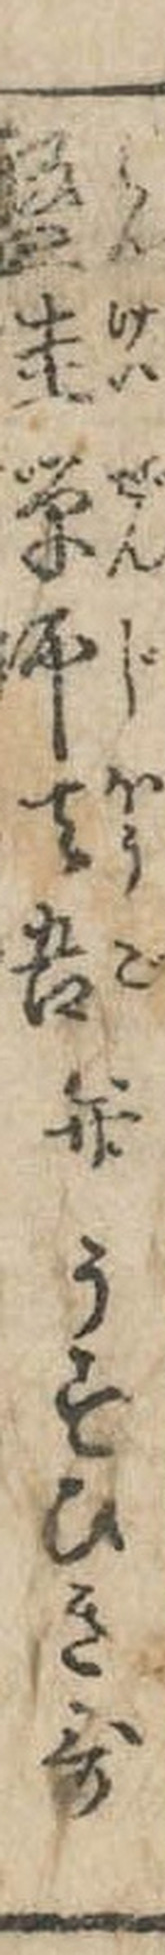盤桂禅師法語并うすひき歌
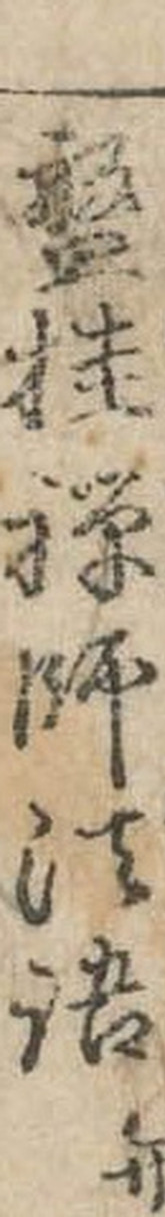梅天禅師法語
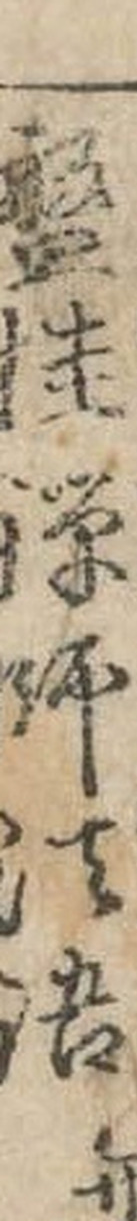梅天禅師法語
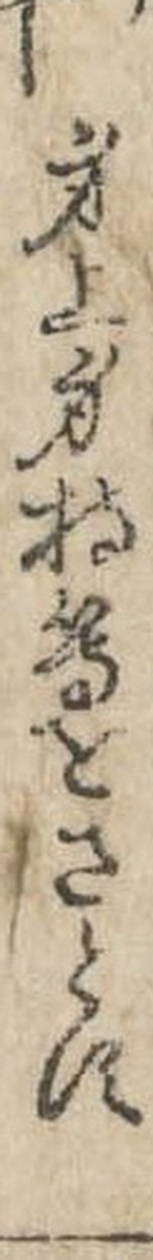身上身持等をさとす
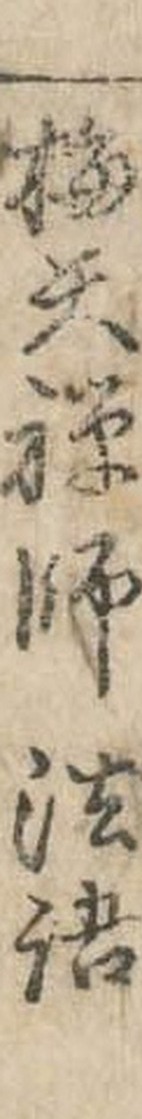梅天禅師法語
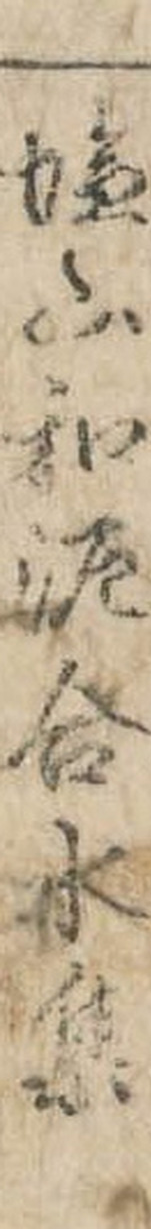塩山和泥合水集
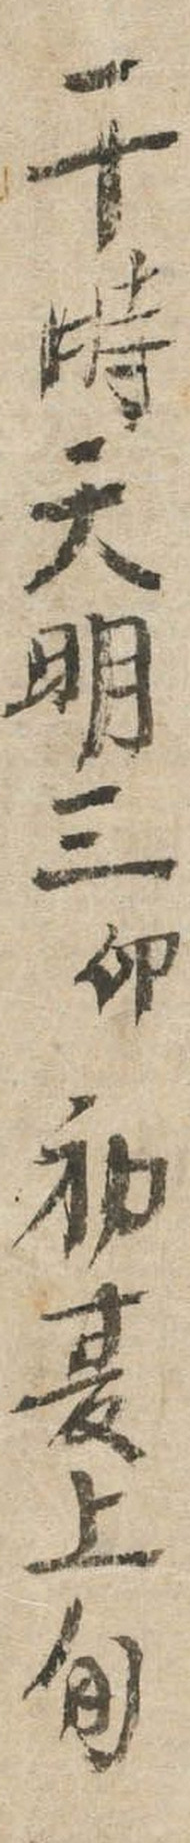于時天明三卯初夏上旬
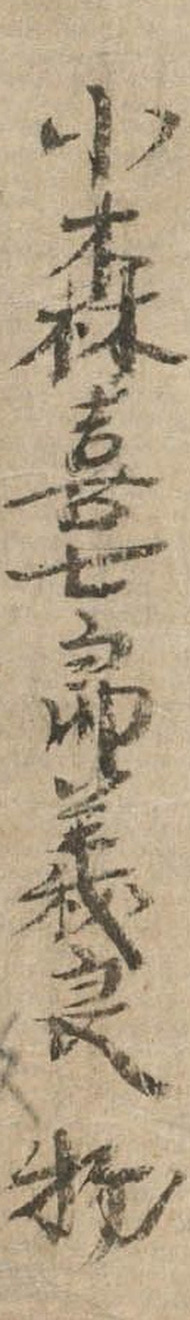小森喜七郎義良物
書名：前訓
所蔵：東京学芸大学附属図書館
